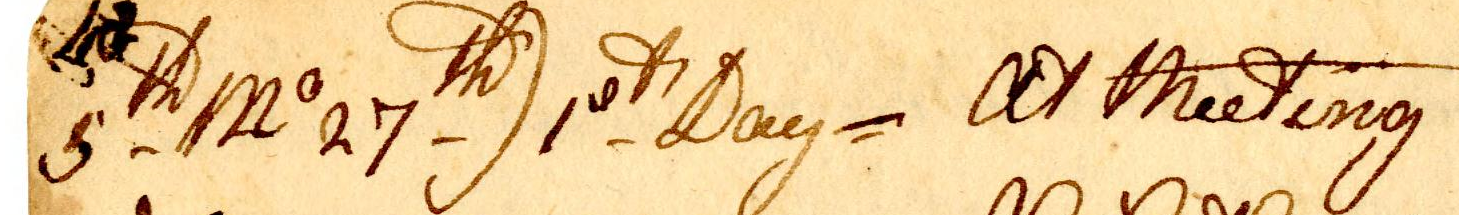5^th M^o 27^th) 1^st Day- At Meeting
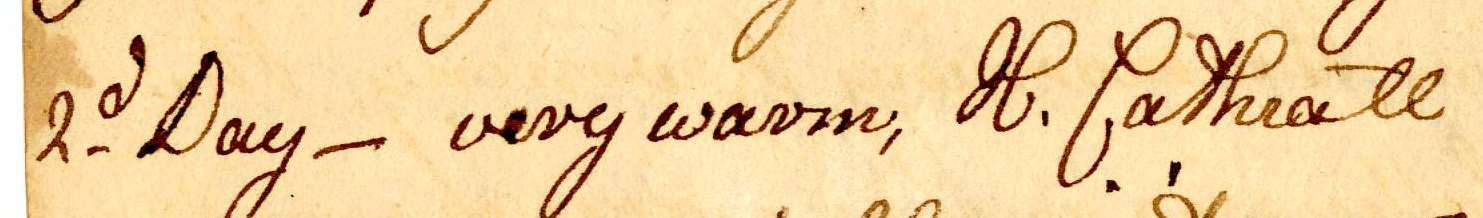2^d- Day- very warm, H. Cathrall
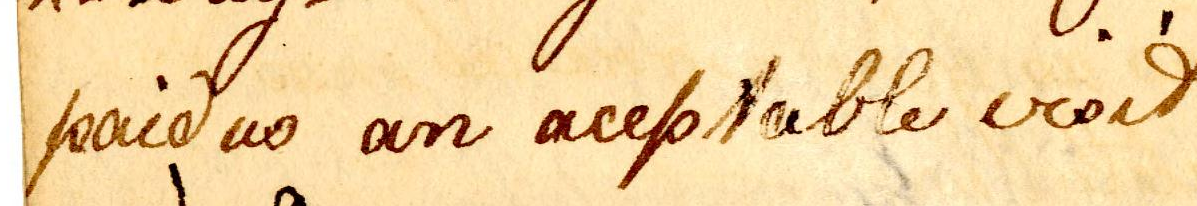paid us an aceptable visit
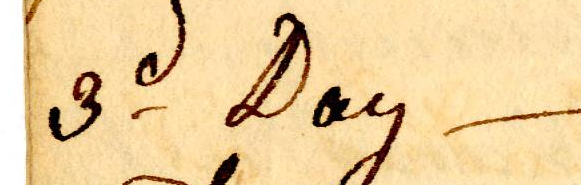3^d- Day-
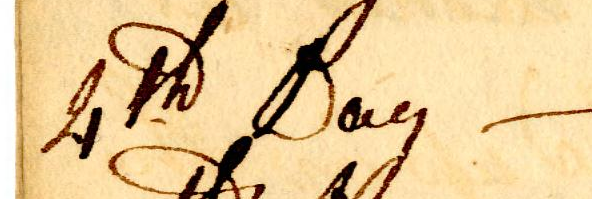4^th Day-
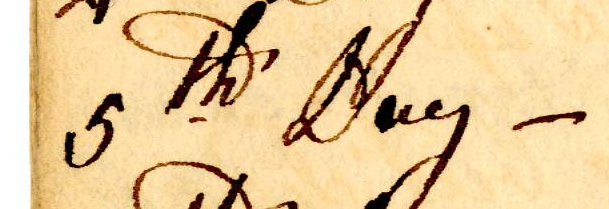5^th Day-
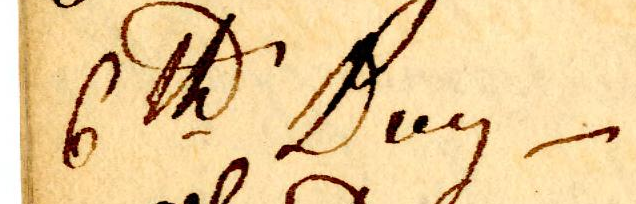6^th Day-
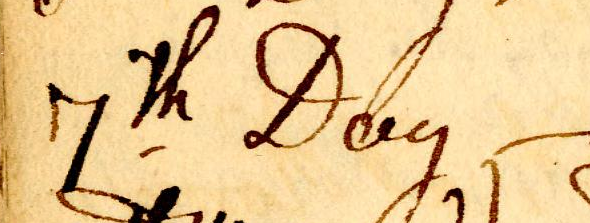7^th Day-
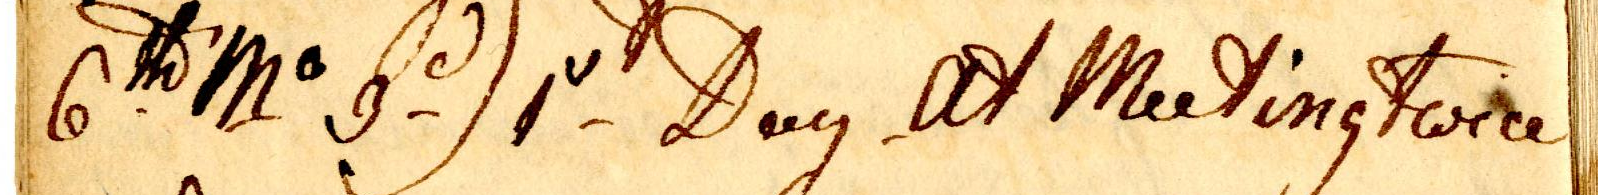6^th M^0 3^d) 1^st Day- At Meeting twice
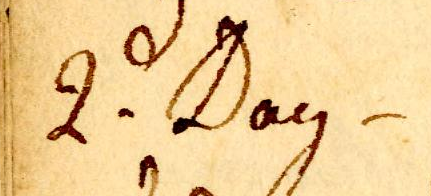2^d Day-
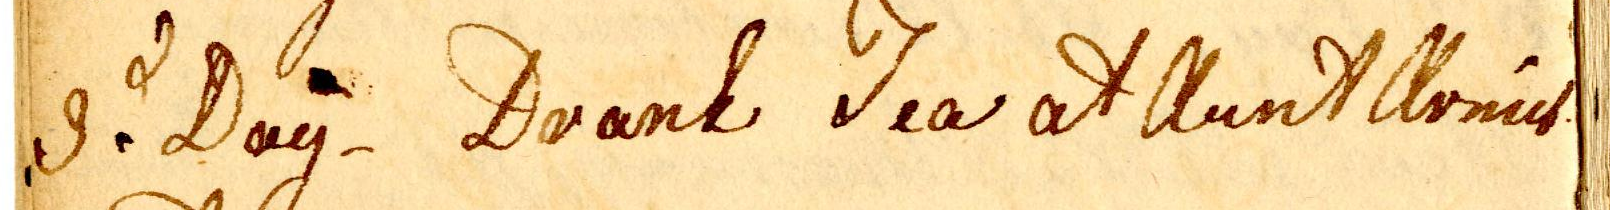3^d Day- Drank Tea at Aunt Armit
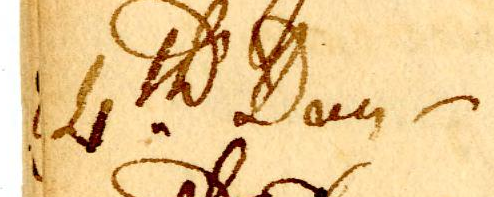4^th Day-
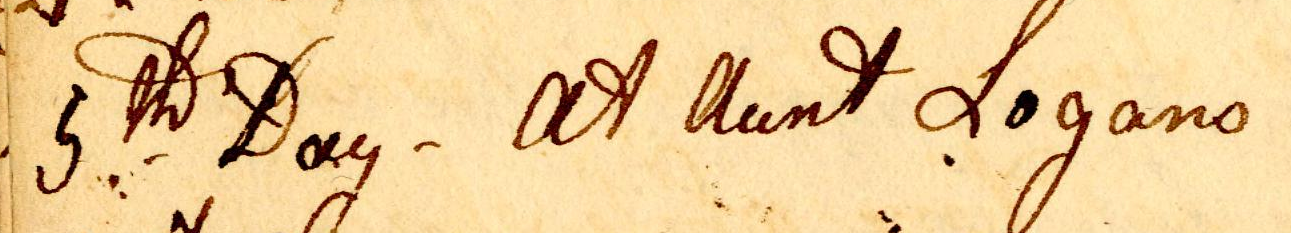5^th Day- At Aunt Logans
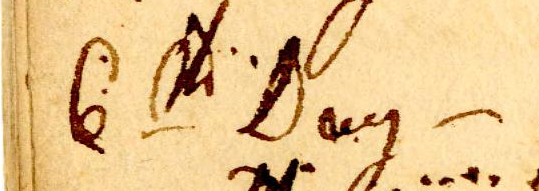6^th Day
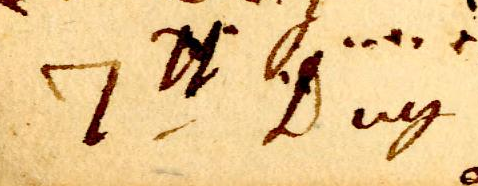7^th Day
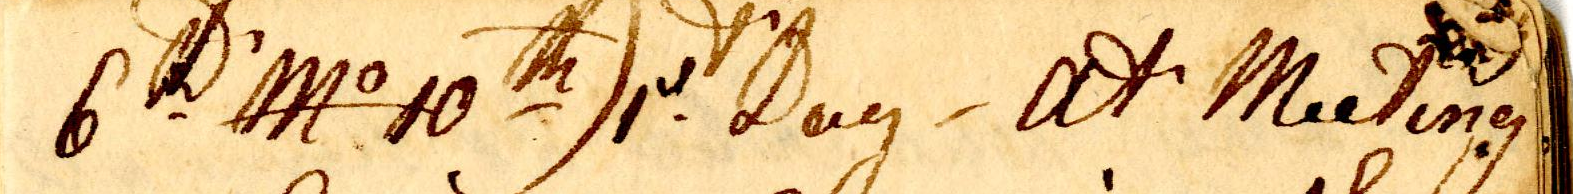6^th M^o 10^th) 1^st Day- At Meeting
